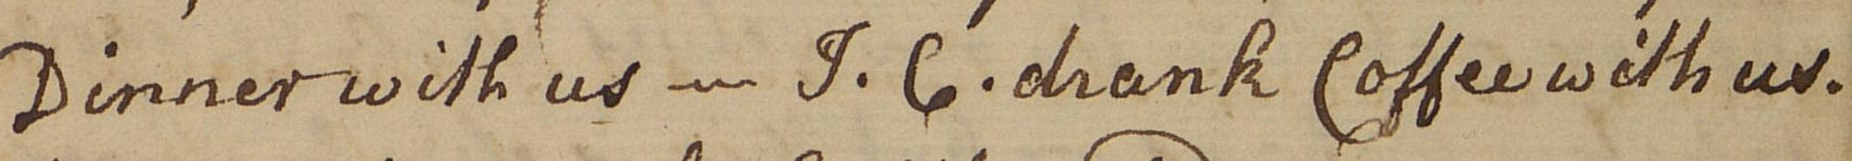Dinner with us- I.C. drank Coffee with us.
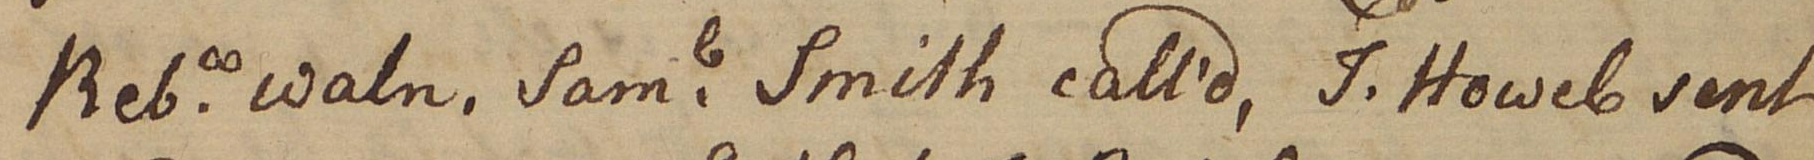Reb^a. Waln, Sam^l. Smith call'd, T. Howel sent
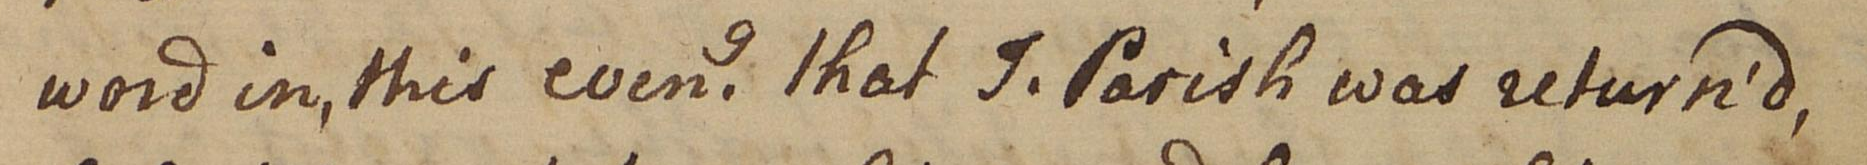word in, this even^g. that T. Parish was return'd,
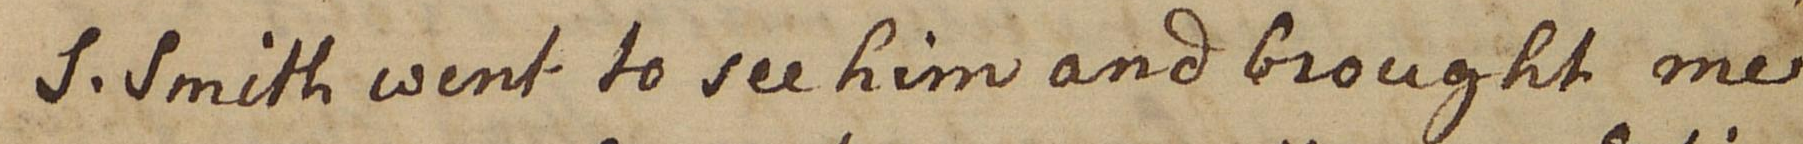S. Smith went to see him and brought me
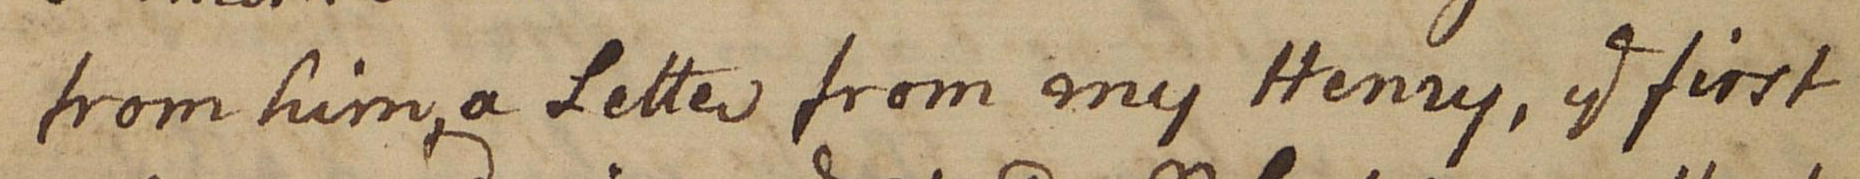from him a Letter from my Henry, y^e first
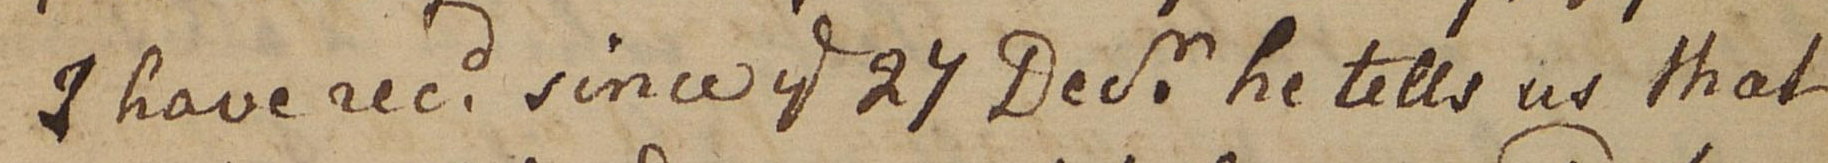I have rec^d. since y^e 24 Dec^r. he tells us that
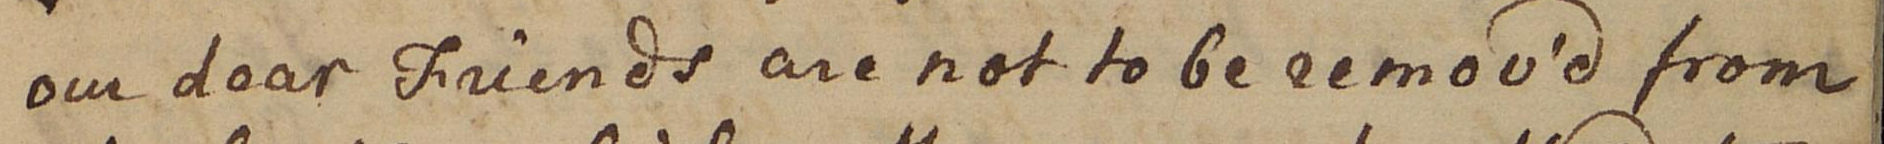our dear Friends are not to be remov'd from
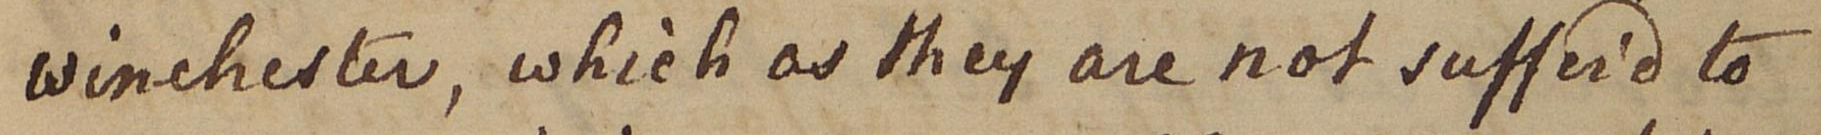Winchester, which as they are not suffer'd to
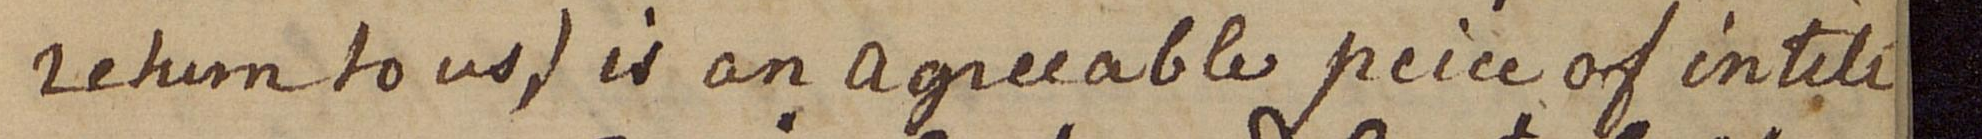return to us) is an agreeable peice of intili
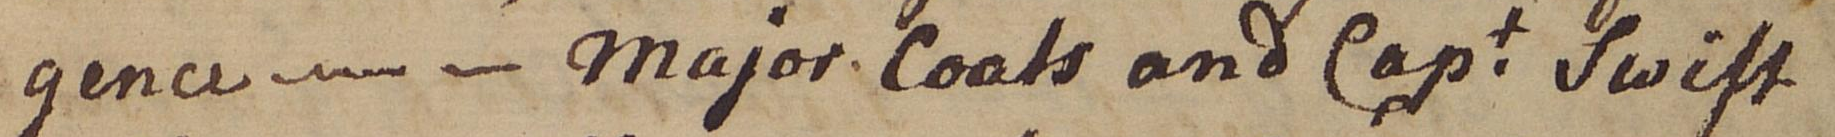gence-- Major Coats and Cap^t. Swift
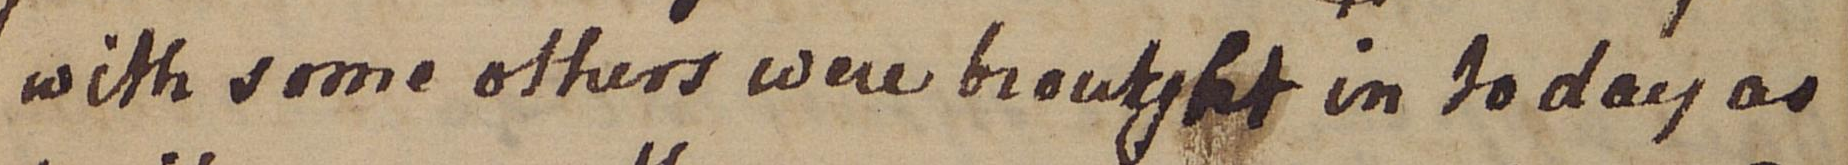with some others were brought in to day as
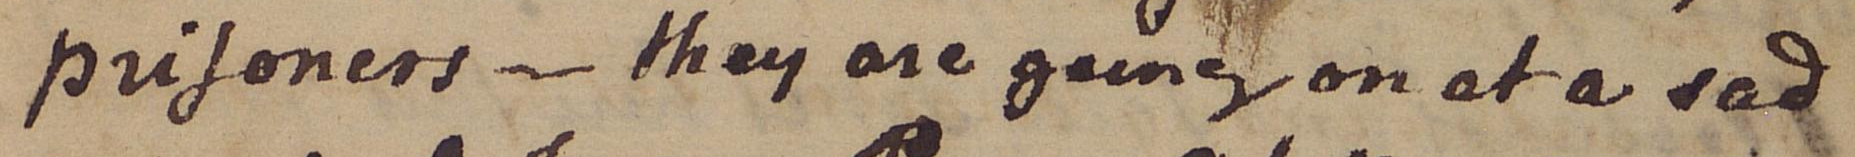prisoners- they are going on at a sad
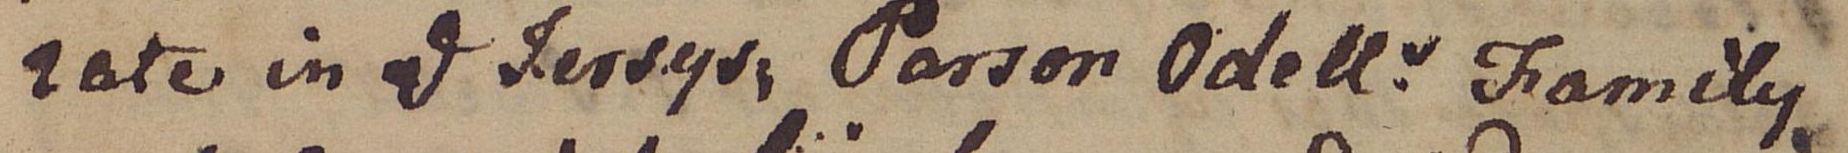rate in y^e Jersys, Parson Odell^s. Family,
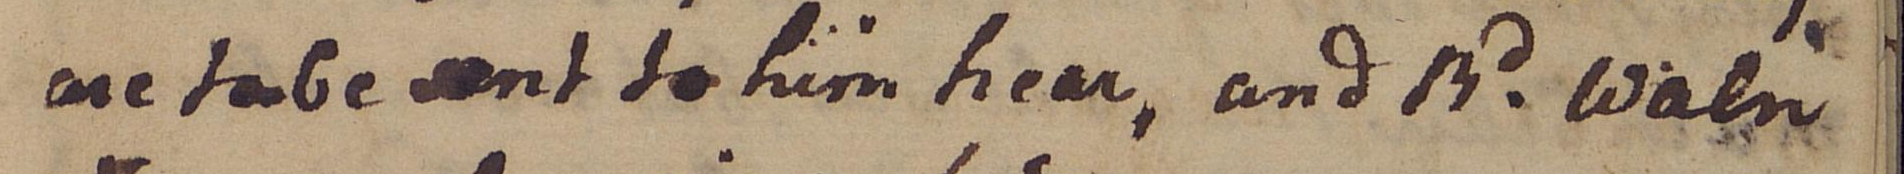are to be sent to him hear, and R^d. Waln
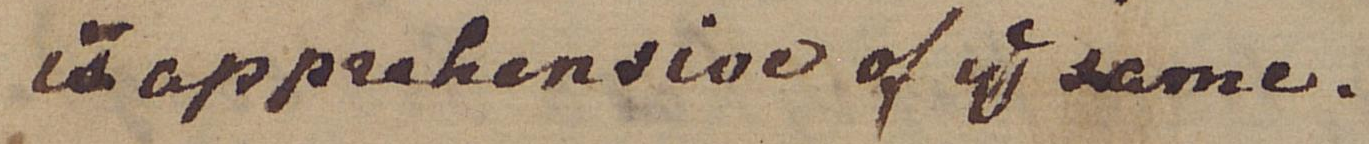is apprehensive of y^e same.
